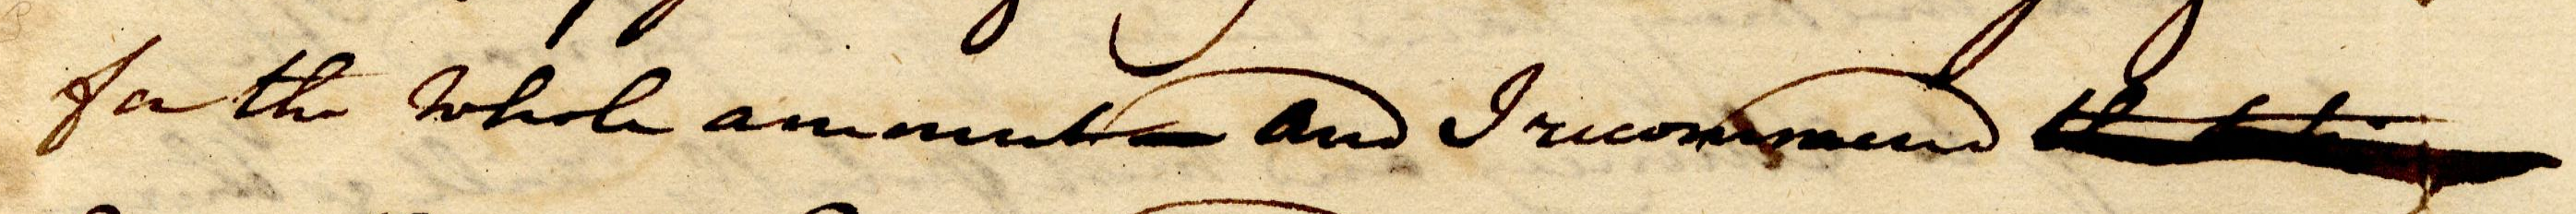for the whole amounts and I recommend [_______]
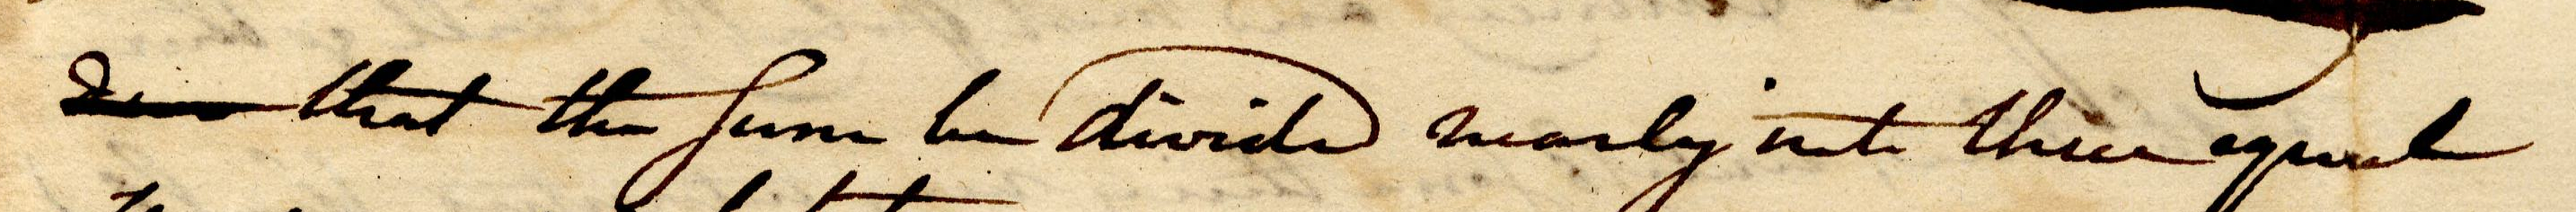[___] that the sum be divided nearly into three equal
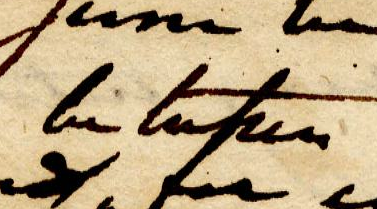be taken
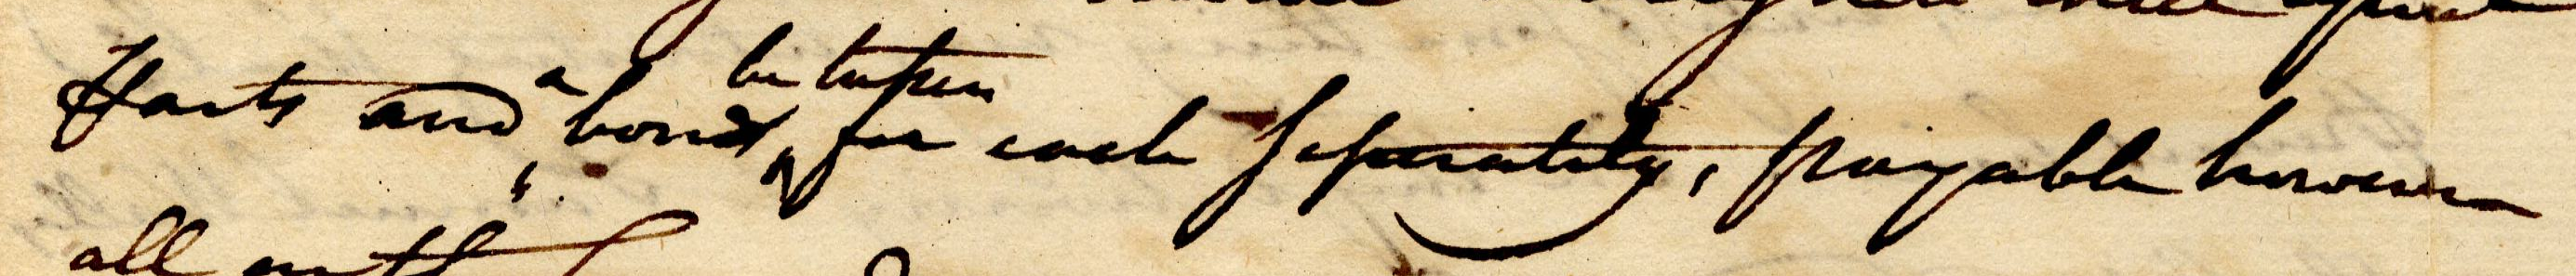parts and ^a bond ^ for cash separately, payable however
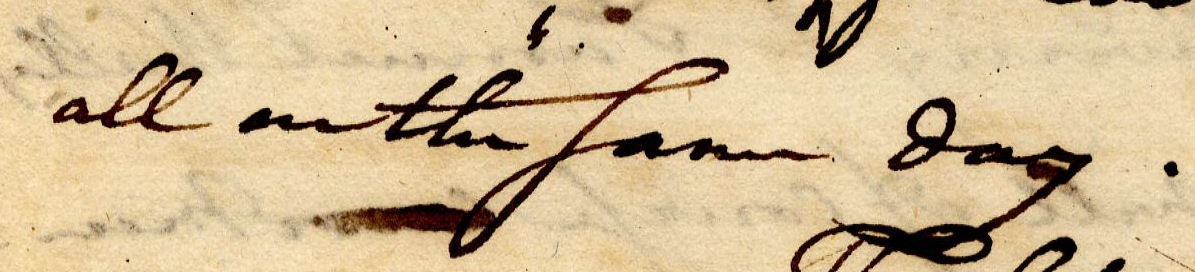all on the same day.
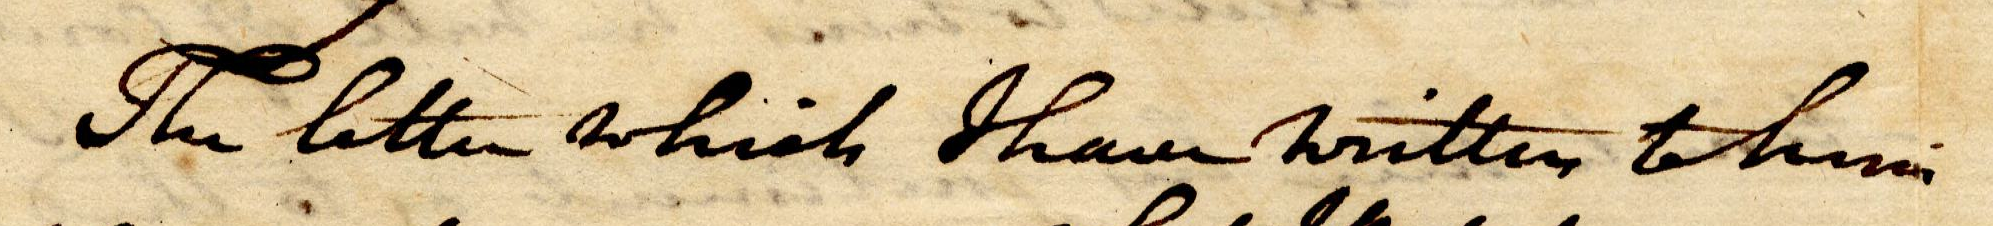The letter which I have written to him
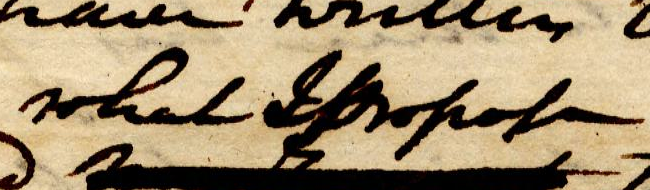what I propose
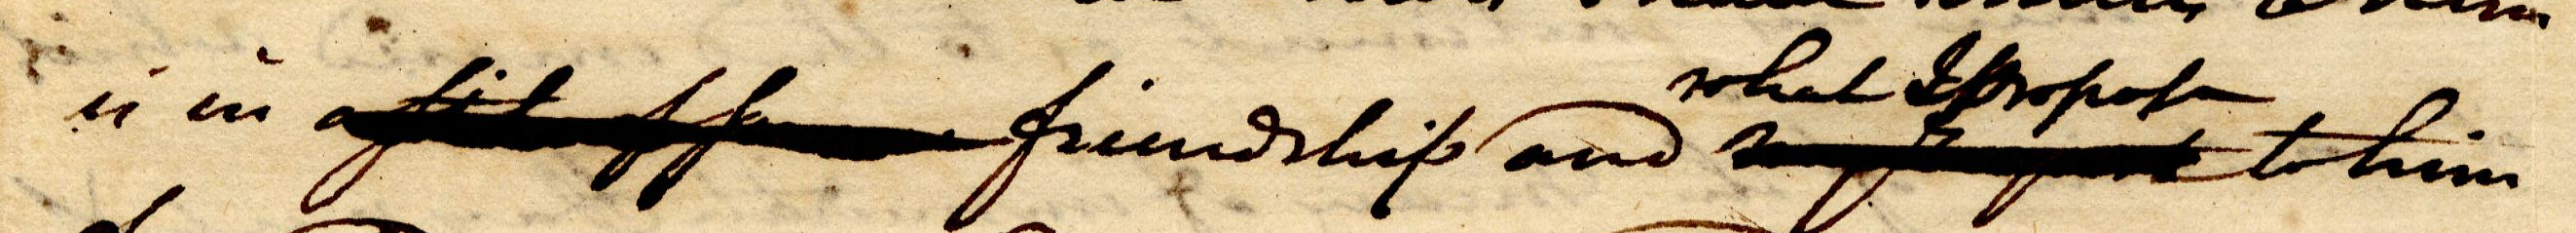is in [_____________] friendship and [__________] to him
